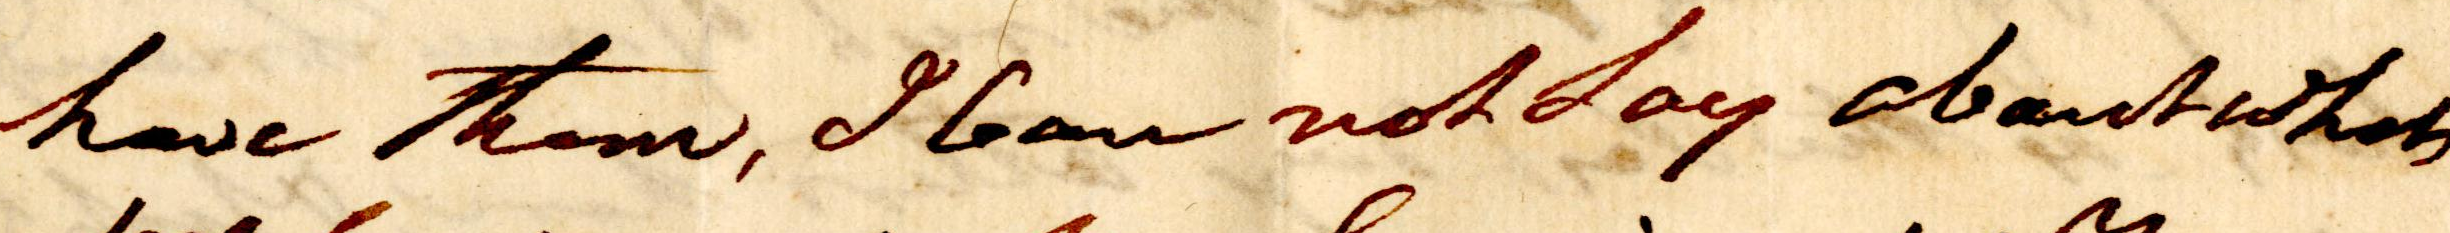have them, I Can not Say about what
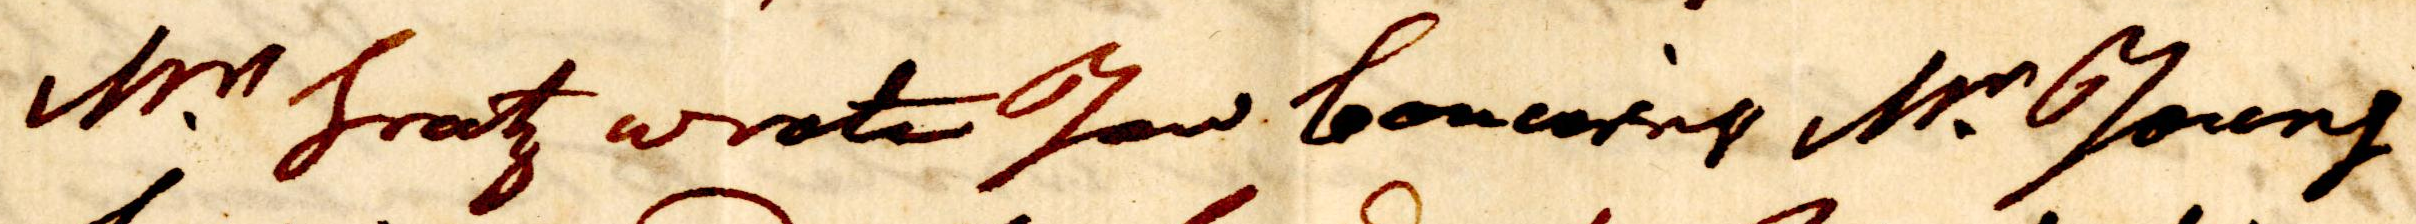M^r. Gratz wrote you concerning M^r. Young
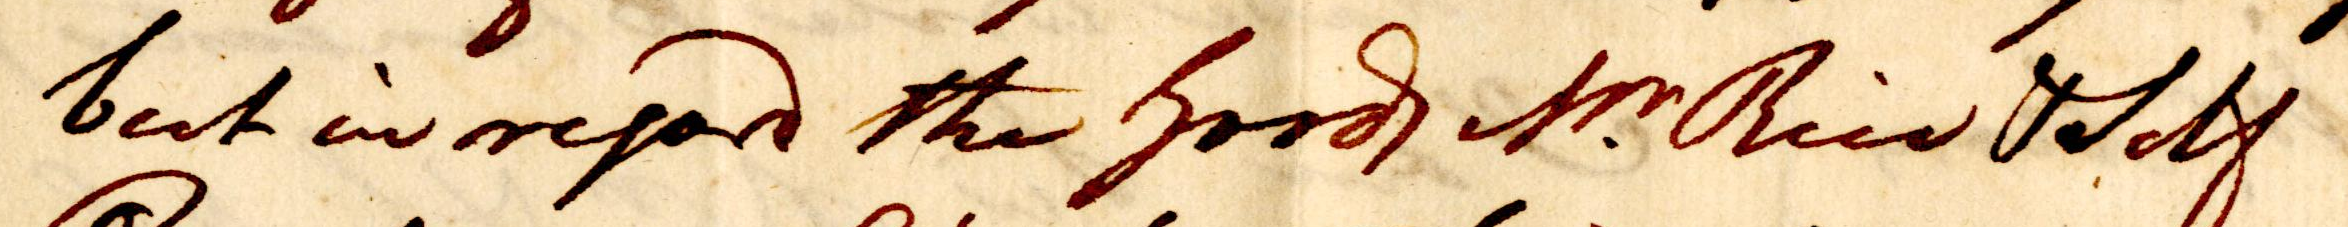but in regard the Goods M^r Rice & Self
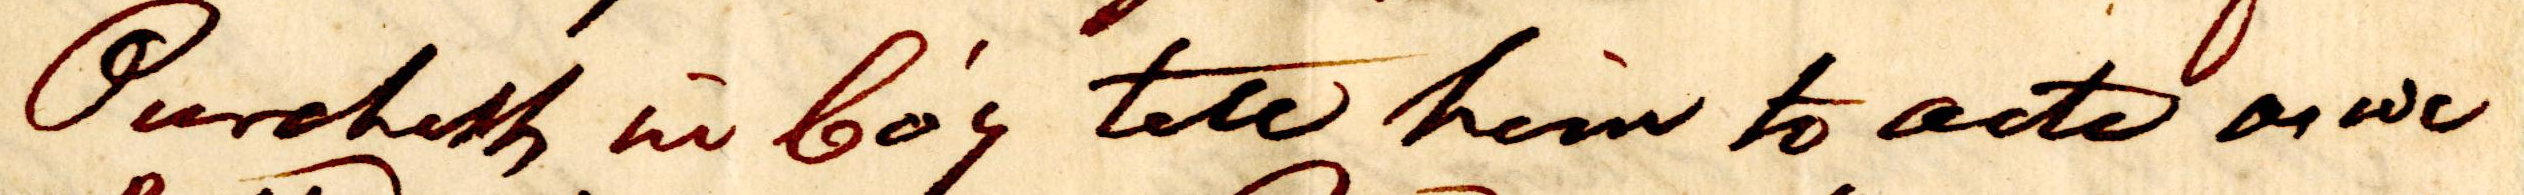purchase in go'g tell him to acte as we
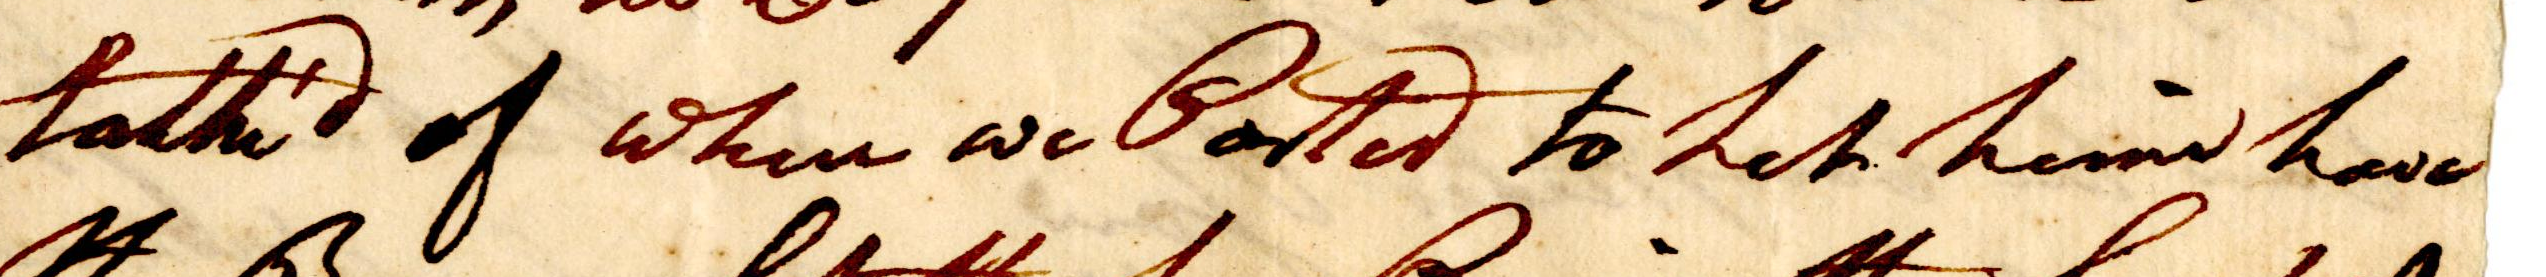talk'd of when we Parted to Let him have
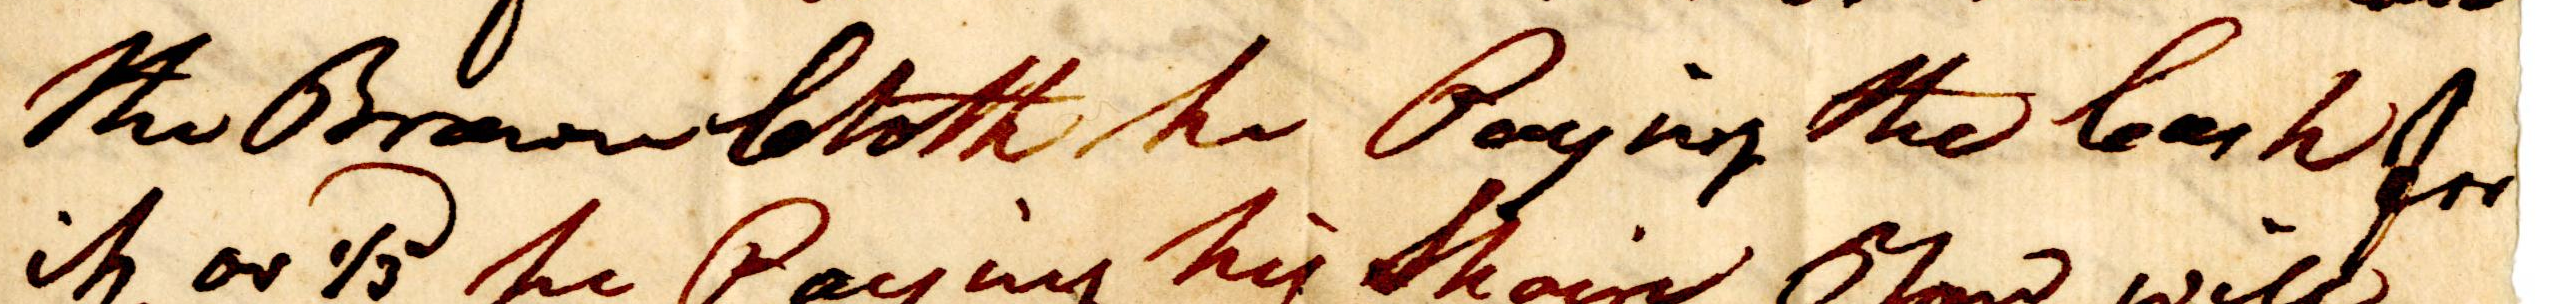the Brown Cloth he Paying the Cash for
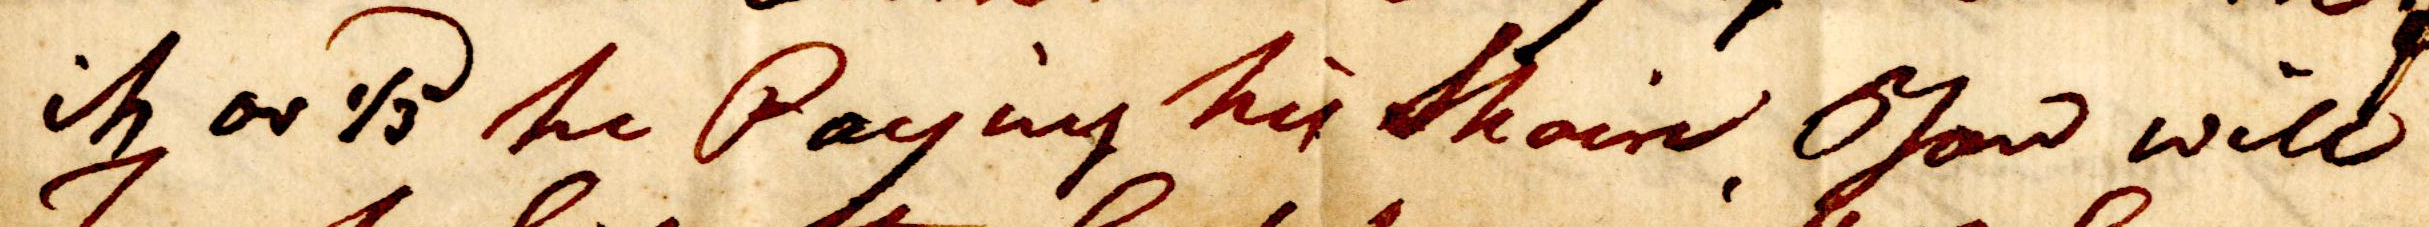it or 1/3^d he Paying his share you will
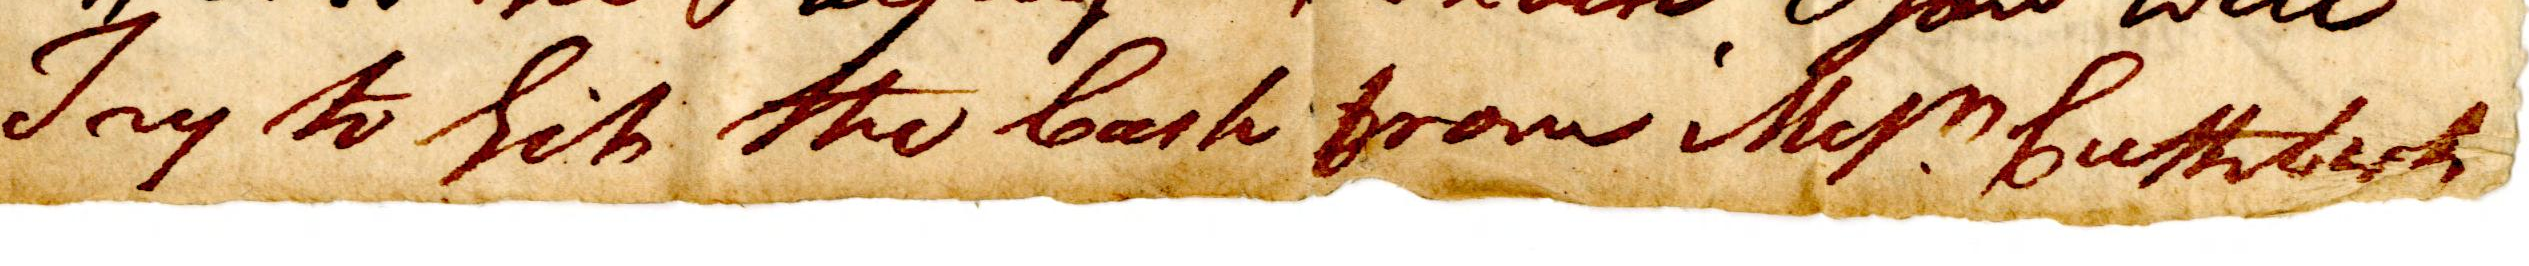say to Git the Cash frome Mess^rs Cuthbert
